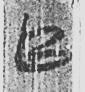𠂤
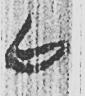㠯（以）
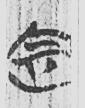定
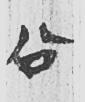公
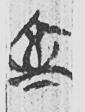室
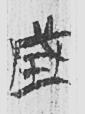城
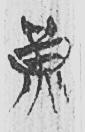黃
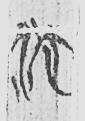池
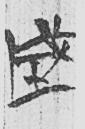城
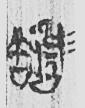罋
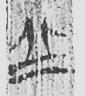丘
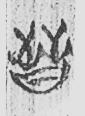晉
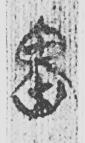{鬼山}
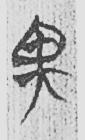𢍉
